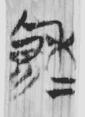穆
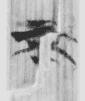不
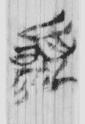顯
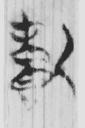{才食卩}
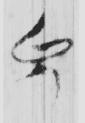允
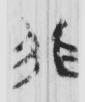非
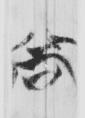尚
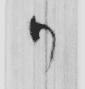人
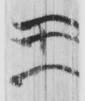王
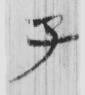子
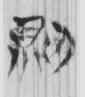則
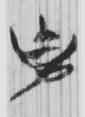克
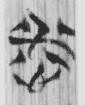悉
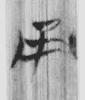甬
